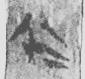八十=
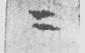二
